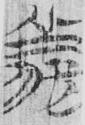義
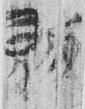則
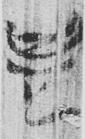兇
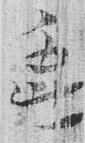○（仁）
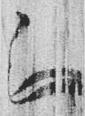㠯（以）
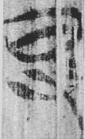𠭁
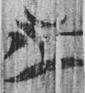之
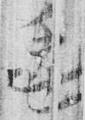○（仁）
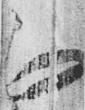㠯（以）
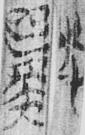獸（守）
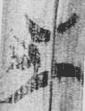之
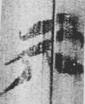亓（其）
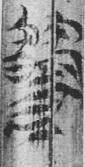○（運）
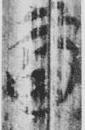百
